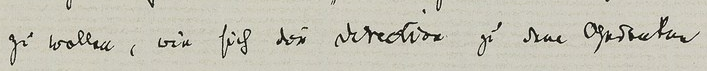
zu wollen, wie sich die Direction zu dem Gedanken
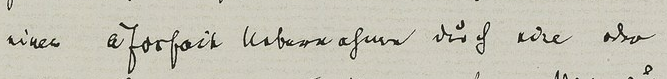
einer à forfait Uebernahme durch eine oder
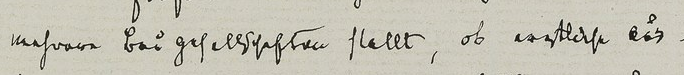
mehrere Baugesellschaften stellt, ob ernstliche Aus-
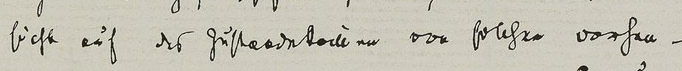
sicht auf das Zustandekommen von solchen vorhan-
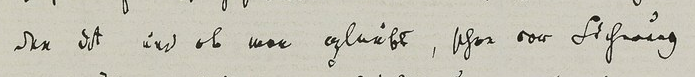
den ist und ob man glaubt, schon vor Sicherung
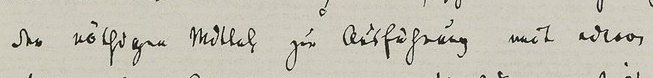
der nöthigen Mittel zur Ausführung mit einer
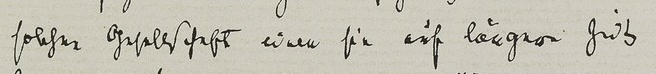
solchen Gesellschaft einen sie auf längere Zeit
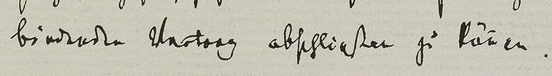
bindenden Vertrag abschließen zu können.
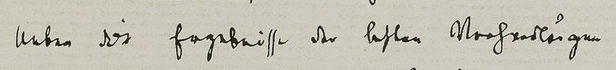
Ueber die Ergebnisse der lezten Verhandlungen
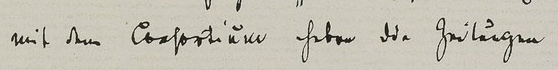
mit dem Consortium haben die Zeitungen
